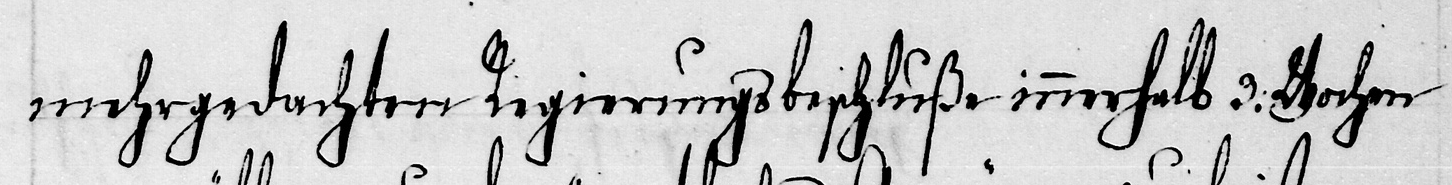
mehrgedachten Regierungsbeschluße innerhalb 3. Wochen
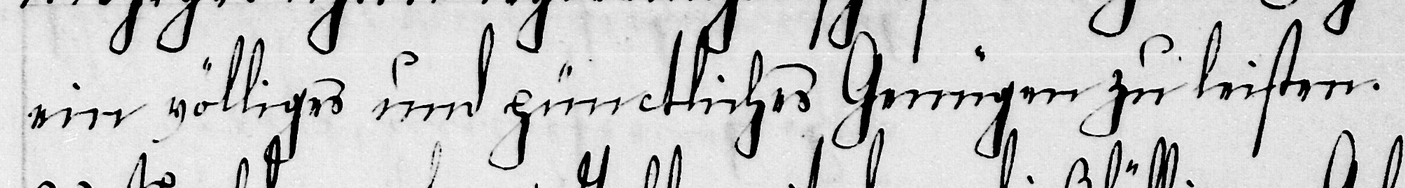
ein völliges und pünctliches Genügen zu leisten.
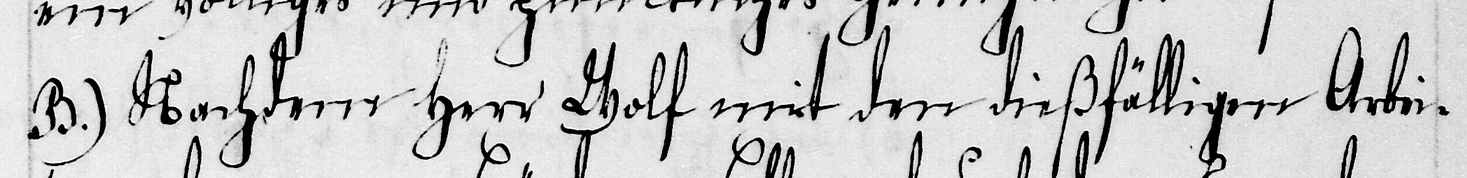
B.) Nachdem Herr Wolf mit den dießfälligen Arbei¬
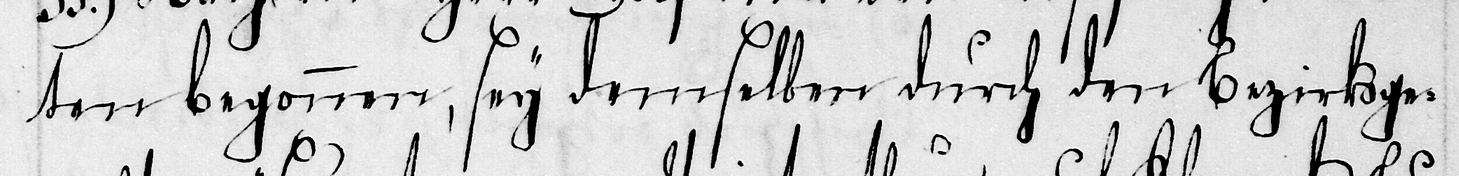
ten begonnen, sey demselben durch den Bezirksge¬
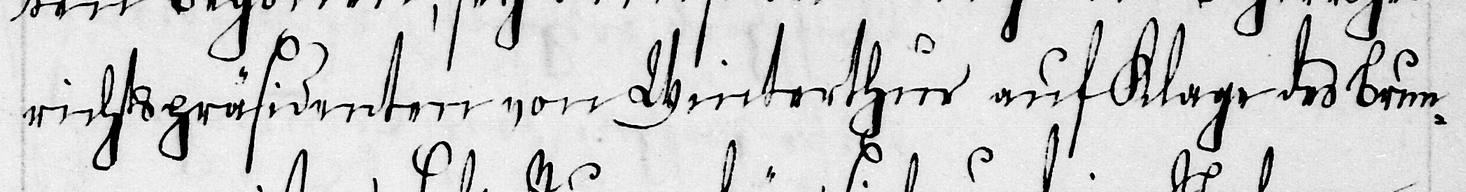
richtspräsidenten von Winterthur auf Klage des Brun¬
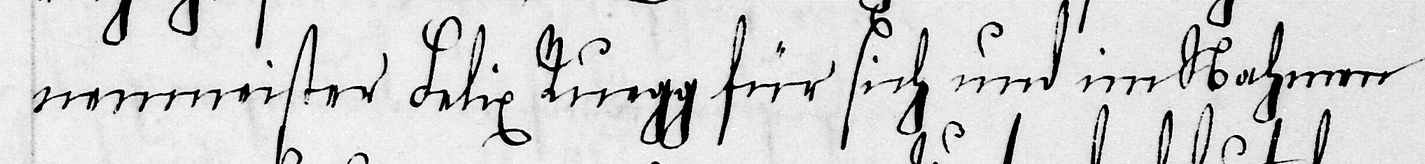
nenmeister Felix Ruegg für sich und im Nahmen
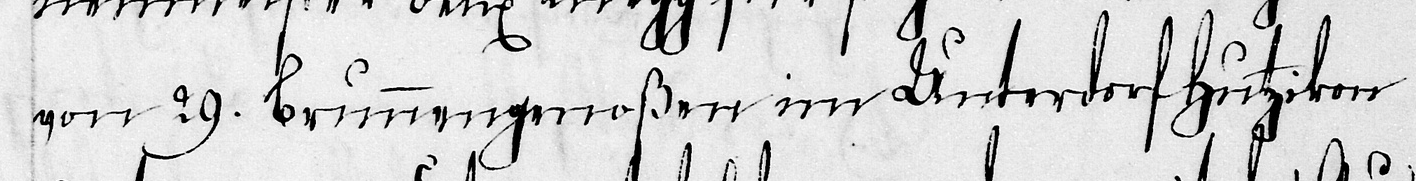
von 29. Brunnengenoßen im Unterdorf Hutzikon
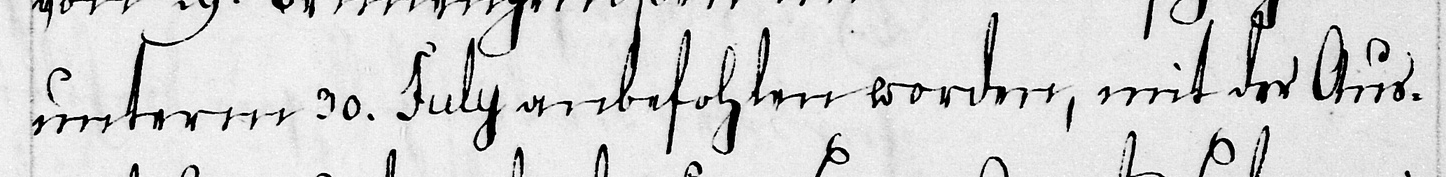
unterm 30. July anbefohlen worden, mit der Aus¬
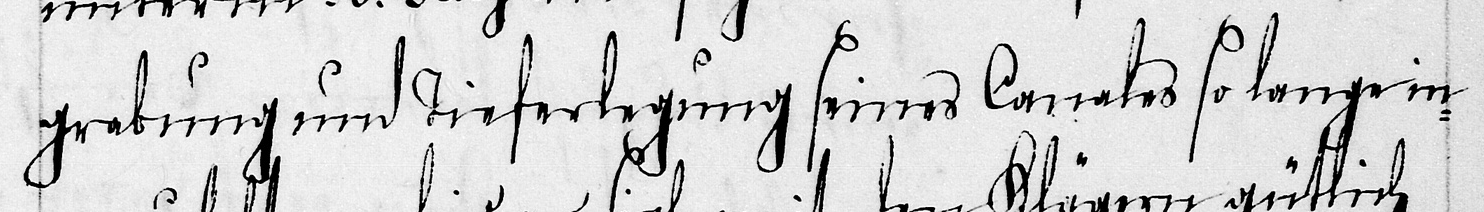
grabung und Tieferlegung seines Canales so lange in¬
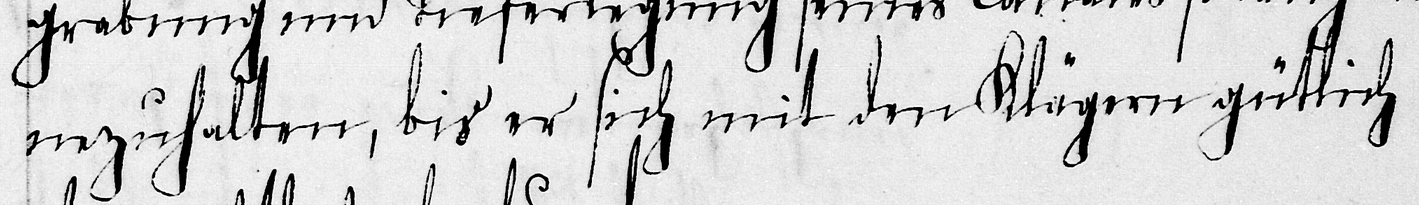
nezuhalten, bis er sich mit den Klägern gütlich
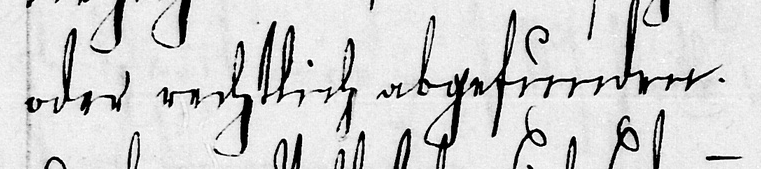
oder rechtlich abgefunden.
